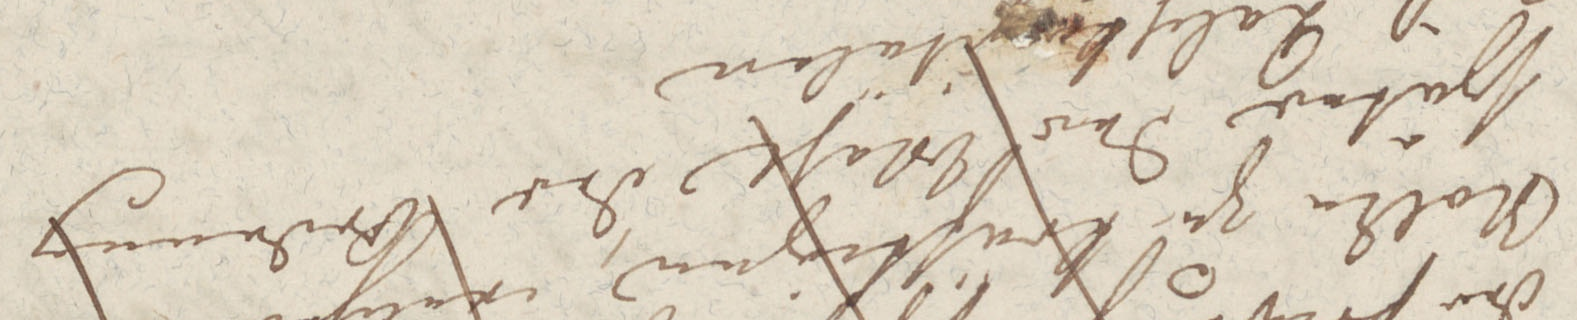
der durch der mittels eines mehrfach
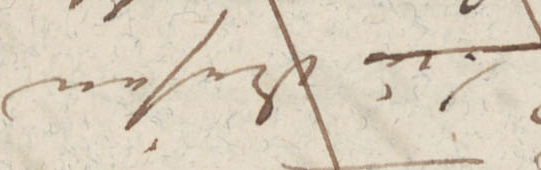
Priestergedanke,
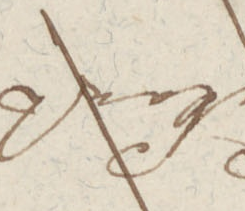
diesen
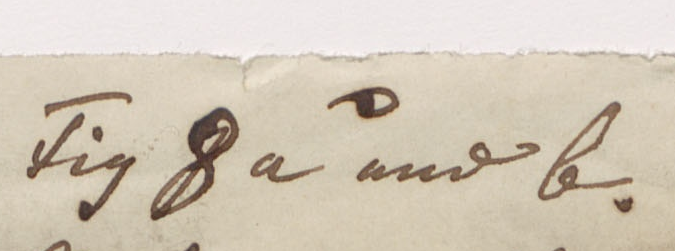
Fig 78a und b.
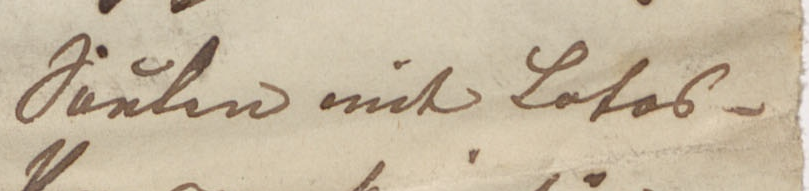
Säulen mit Lotos-
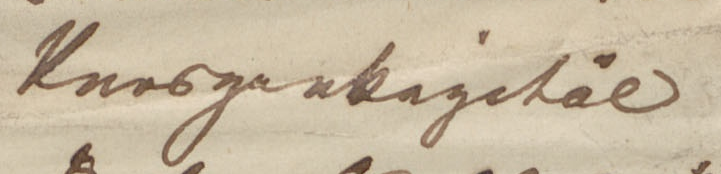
knospenkapitäl
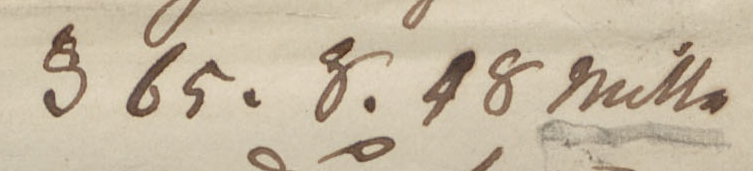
§ 65. S. 48 Mitte
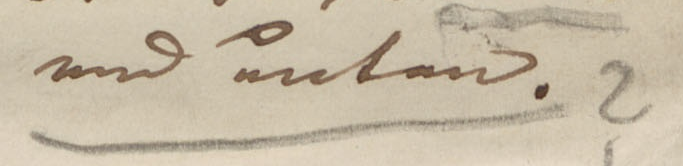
und unten.?
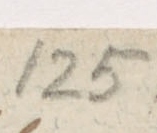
125
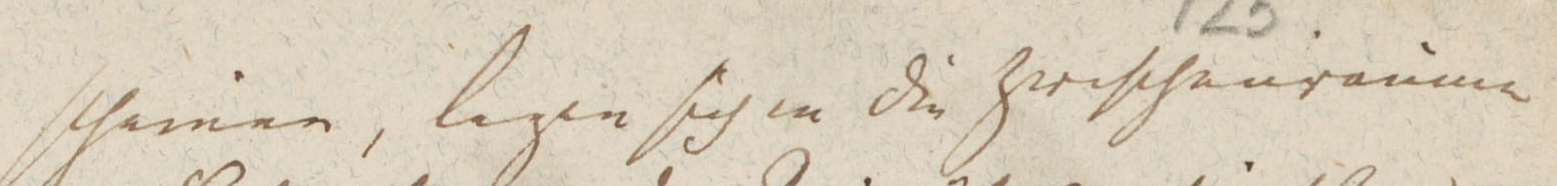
scheinen, legen sich in die Zwischenräume
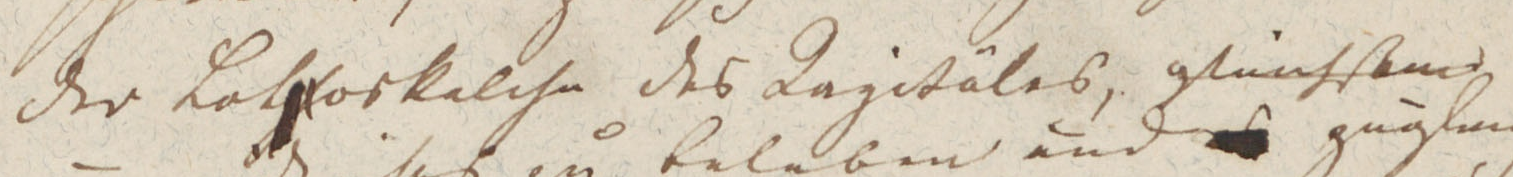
der Lothoskelche des Kapitäles, gleichsam
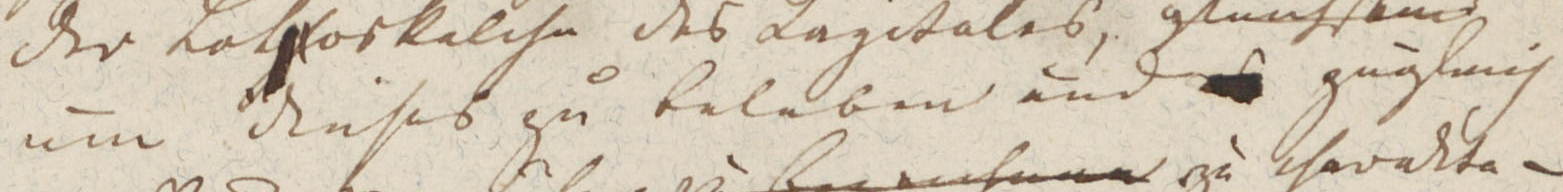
um dieses zu beleben und es zugleich
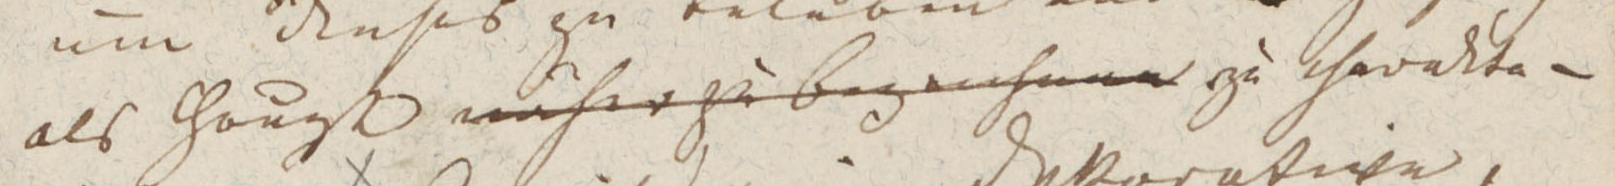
als Haupt näher zu bezeichnen zu charakte-
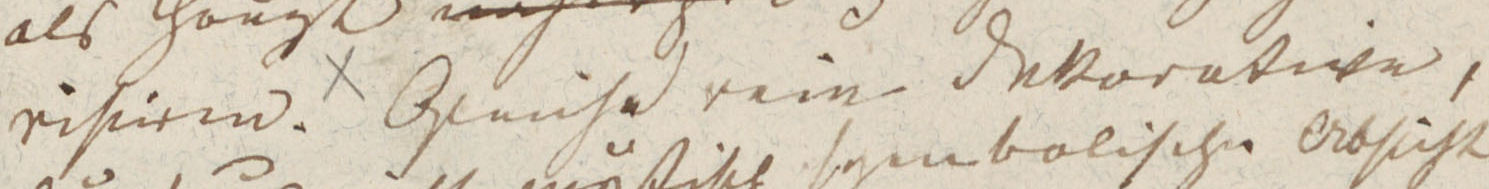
risiren. % Gleiche rein dekorative,
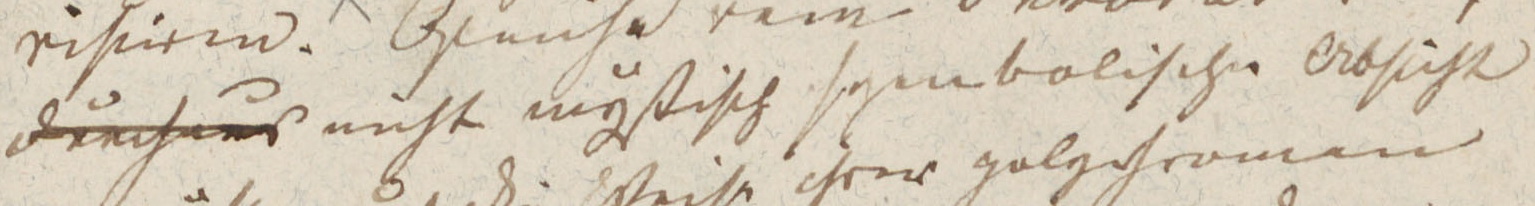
durchaus nicht mystisch symbolische Absicht
